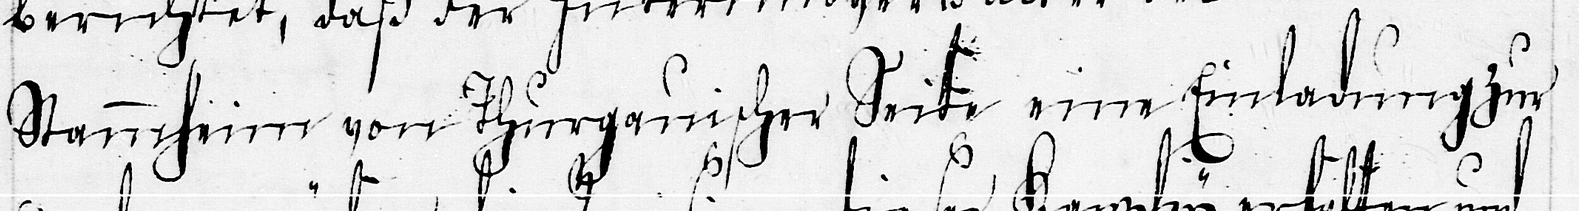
Stammheim von Thurgauischer Seite eine Einladung zur
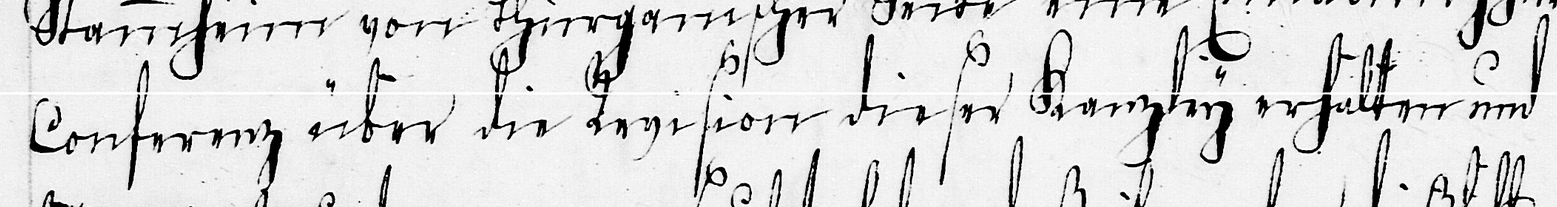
Conferenz über die Revision dieser Kanzley erhalten und
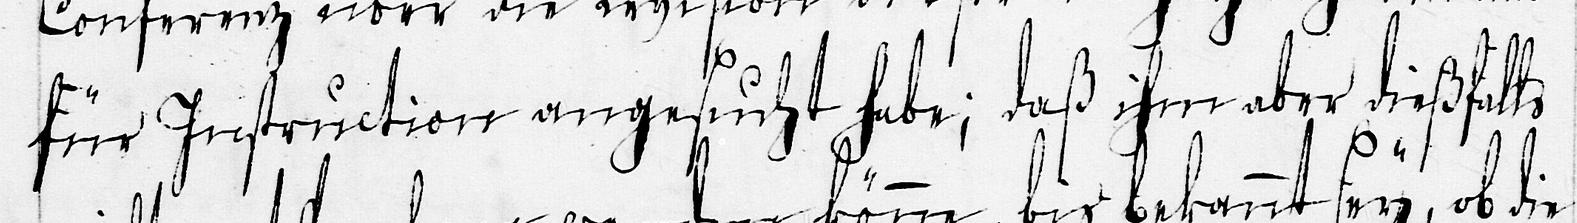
für Instruction angesucht habe; daß ihm aber dießfalls
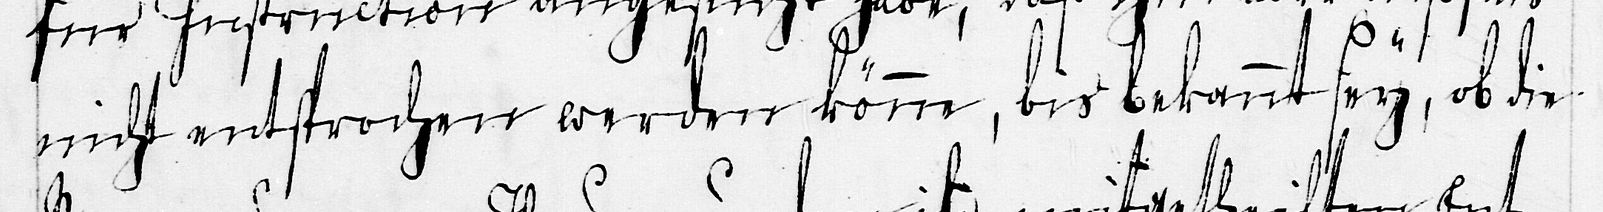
nicht entsprochen werden könne, bis bekannt sey, ob die
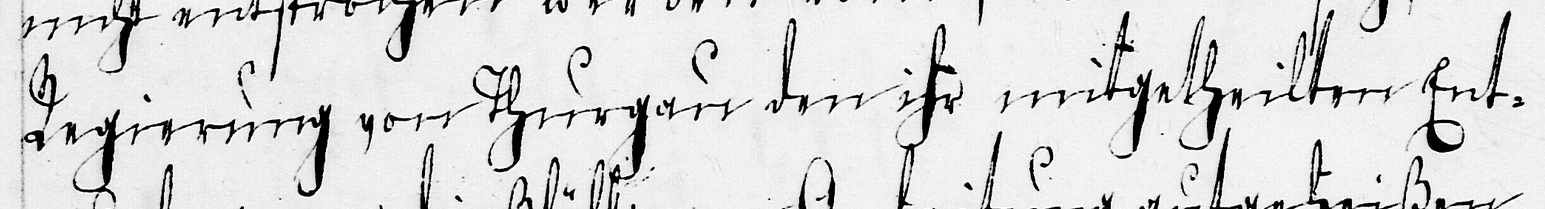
Regierung von Thurgau den ihr mitgetheilten Ent¬
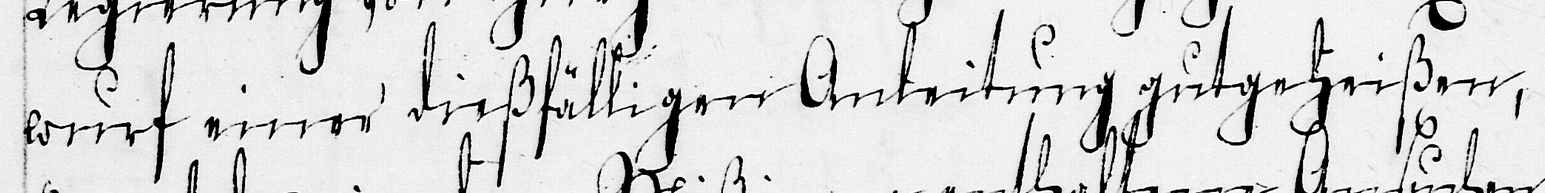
wurf einer dießfälligen Anleitung gutgeheißen,
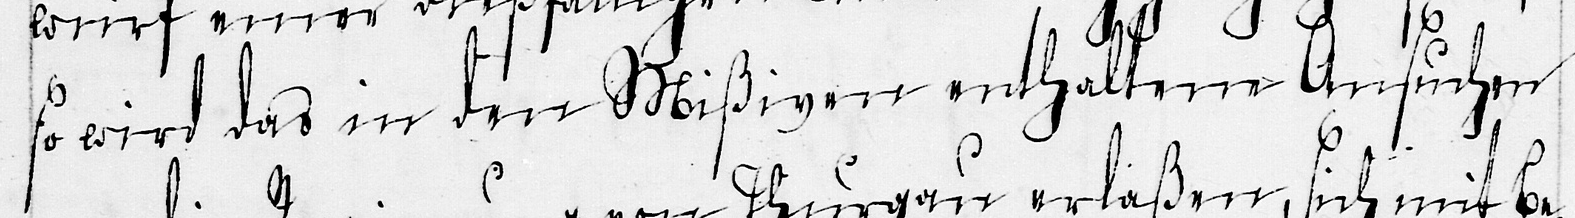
so wird das in den Mißiven enthaltene Ansuchen
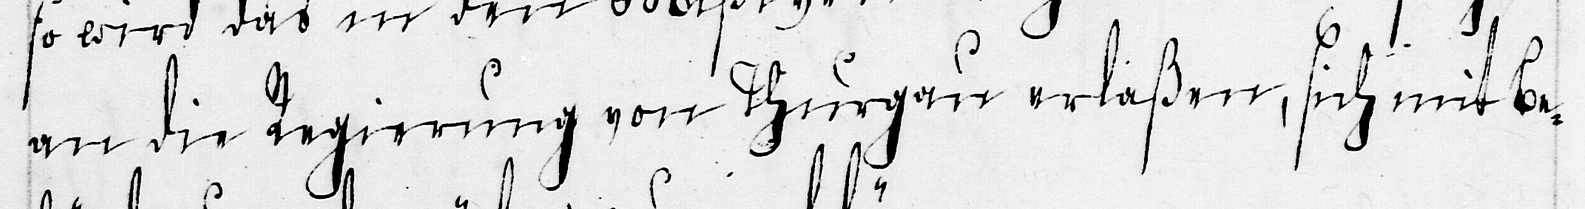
an die Regierung von Thurgau erlaßen, sich mit Be¬
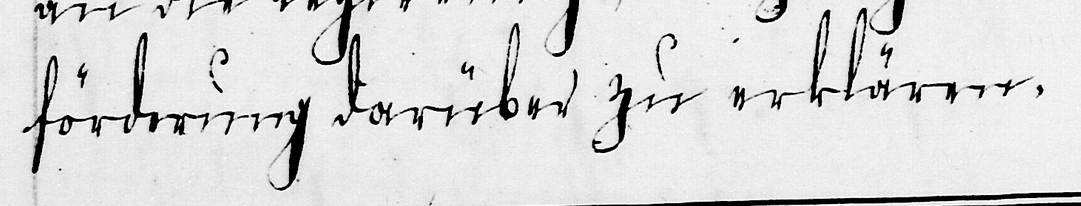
förderung darüber zu erklären.
